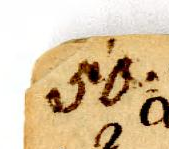50
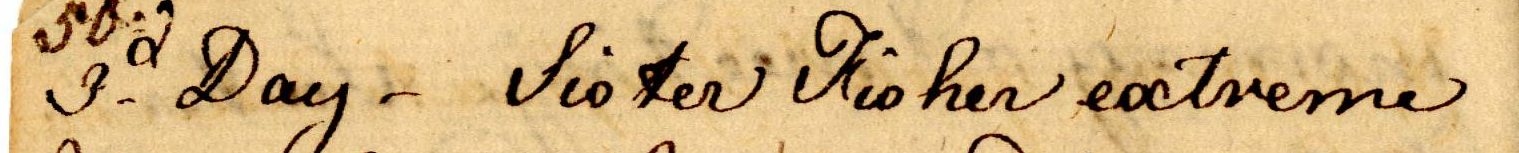3^d Day- Sister Fisher extreme
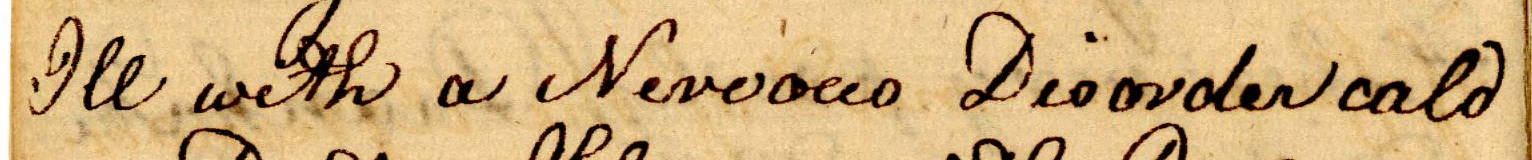Ill with a Nervous Disorder cald
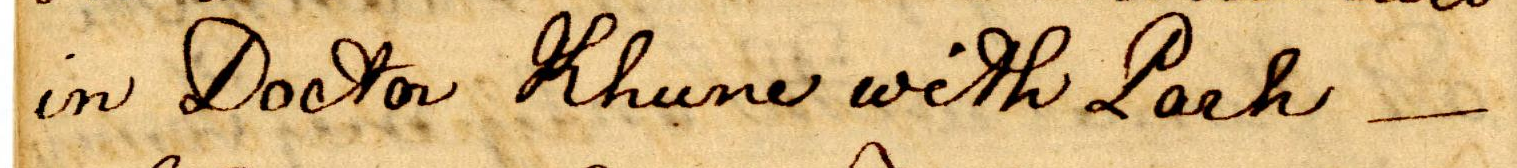in Doctor Khune with Park-
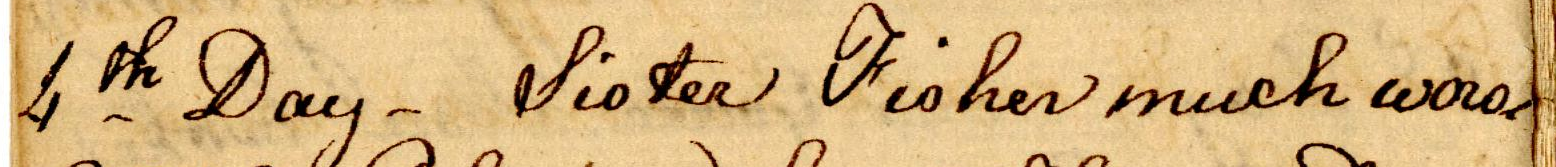4^th Day- Sister Fisher much wors-
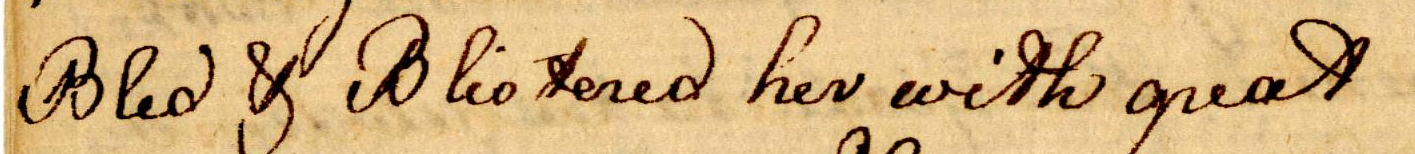Bled & Blistered her with great
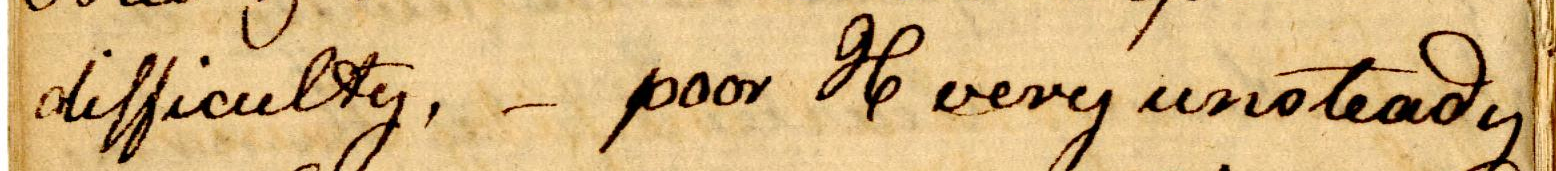difficulty,- poor to very unsteady
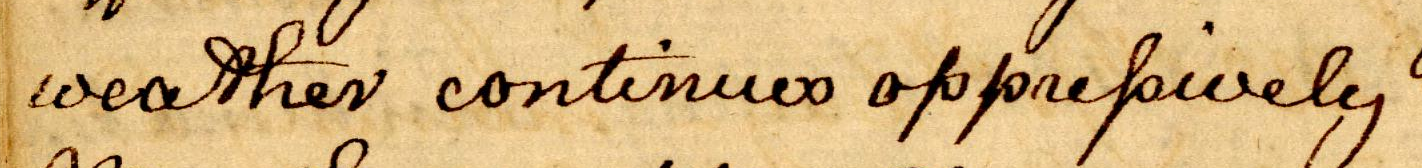weather continues oppressively
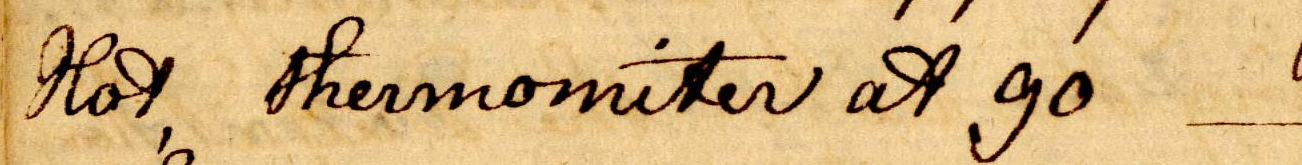Hot, thermomiter at 90
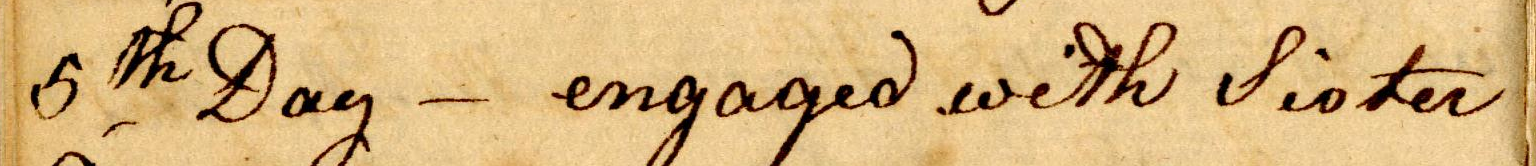5^th Day- engaged with Sister
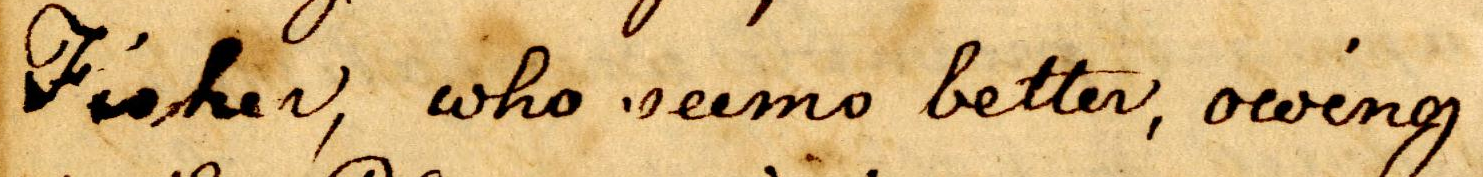Fisher, who seems better, owing
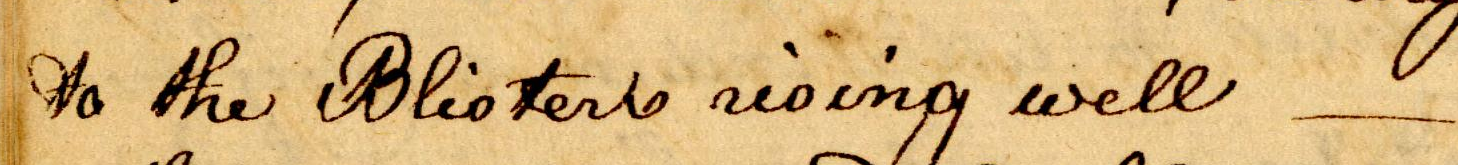to the Blisters rising well-
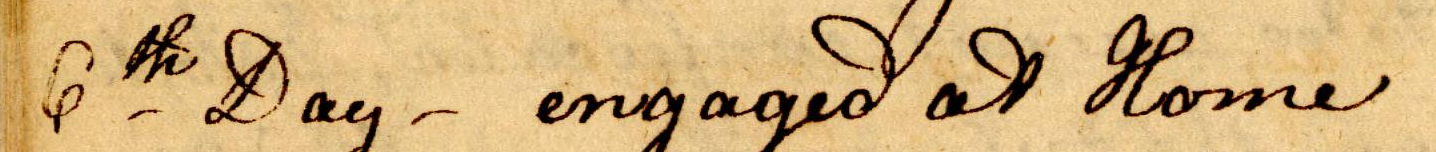6^th Day- engaged at Home
